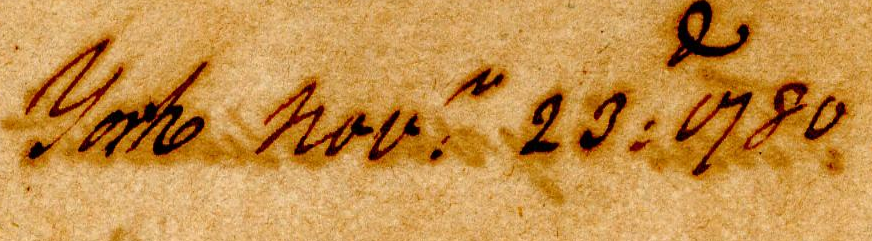York Nov^r. 23^d. 1780
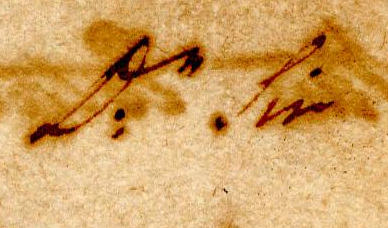D^r Sir
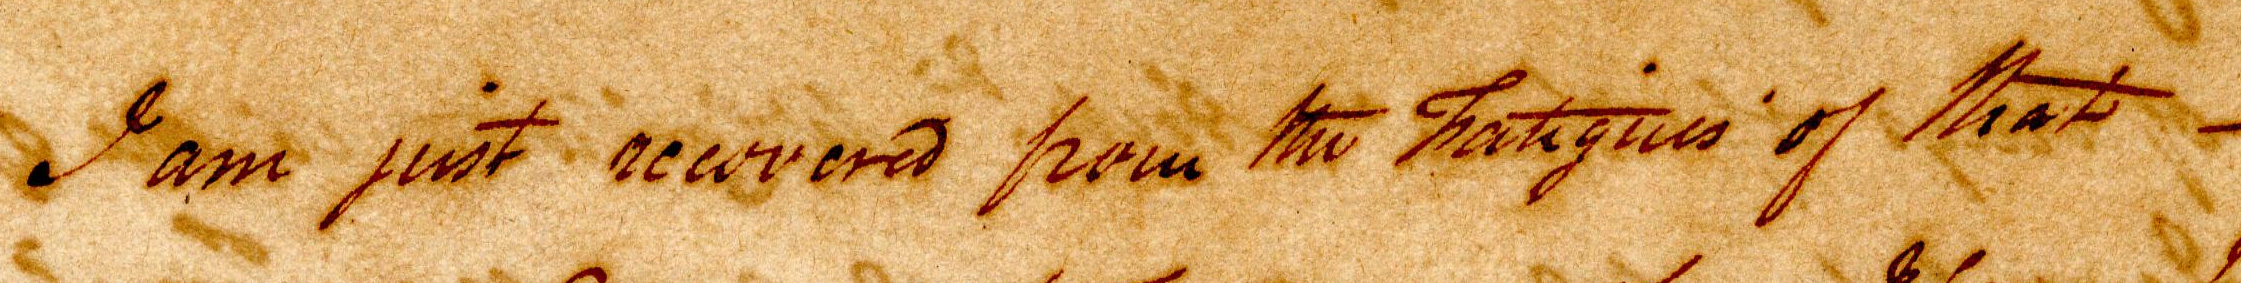I am just recovered from the Fatigues of that
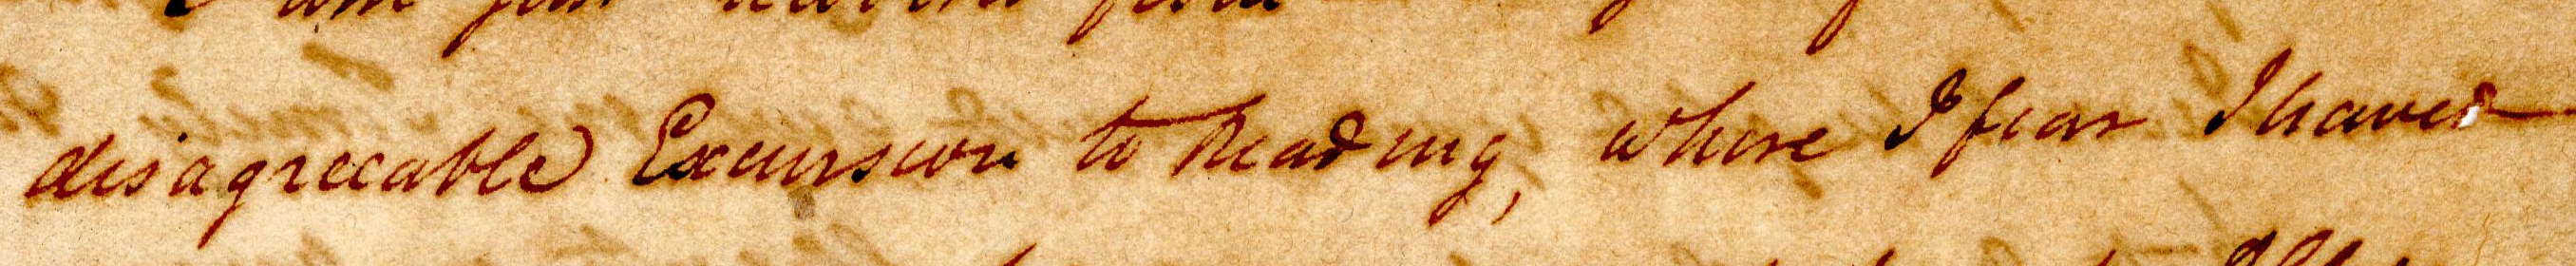disagreeable Excursion to Reading, where I fear I have
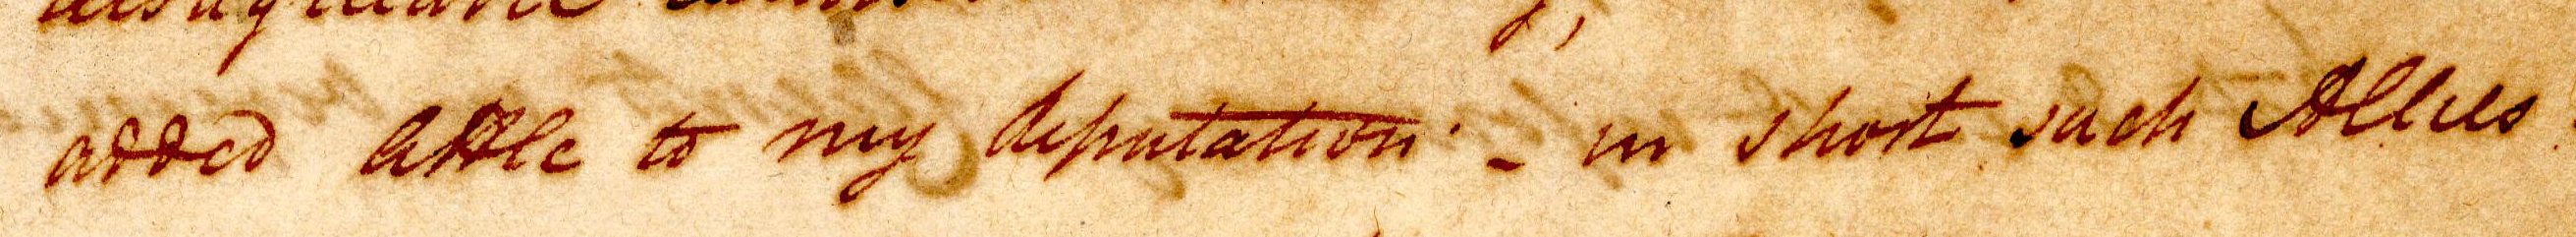added attle to my deputation. in short such Allies
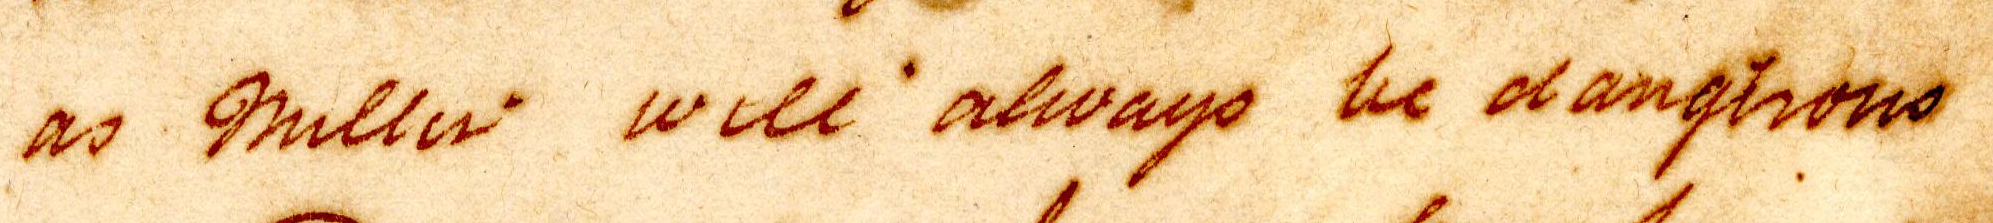as Miller will always be dangerous
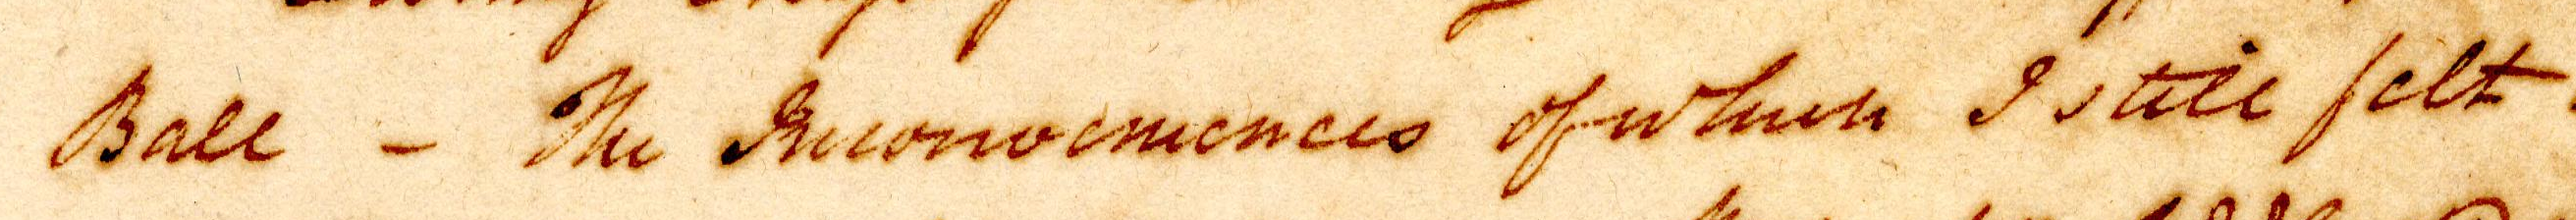Ball. The Reconveniences of which I still felt
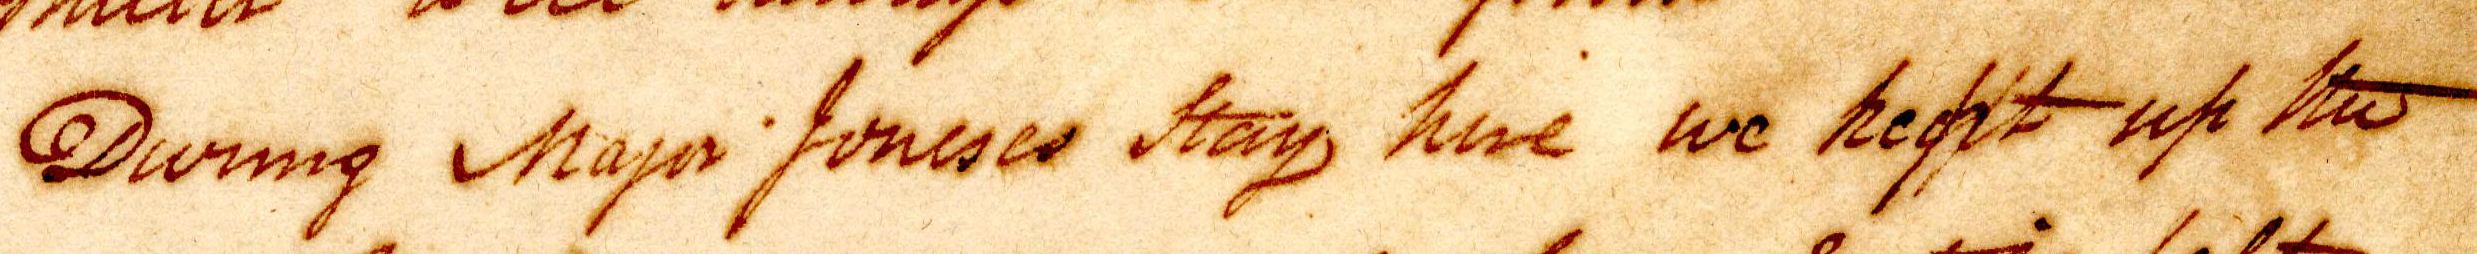During Major Joneses Stay here we heght up the
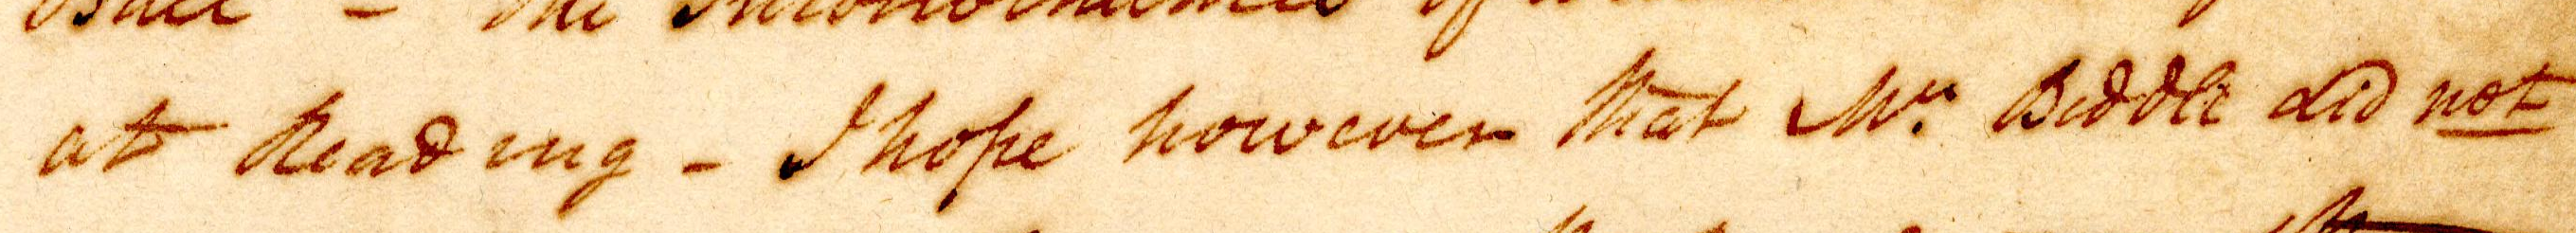at Reading. I hope however that M^r. Diddle did not
